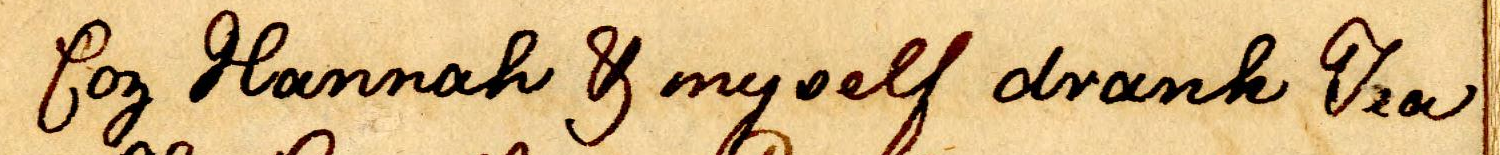Coz Hannah & myself drank Tea
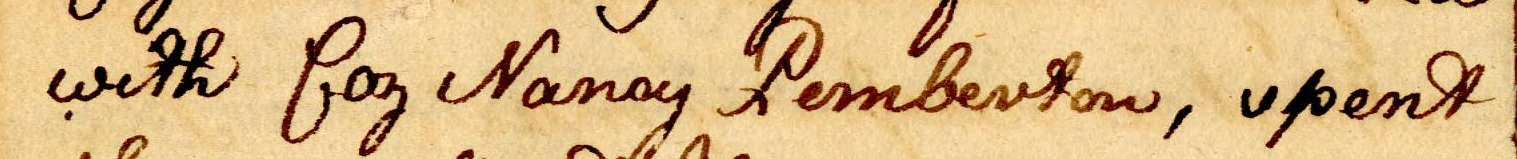with Coz Nancy Pemberton, spent
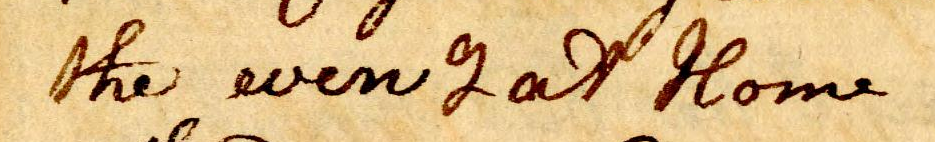the even^g at Home
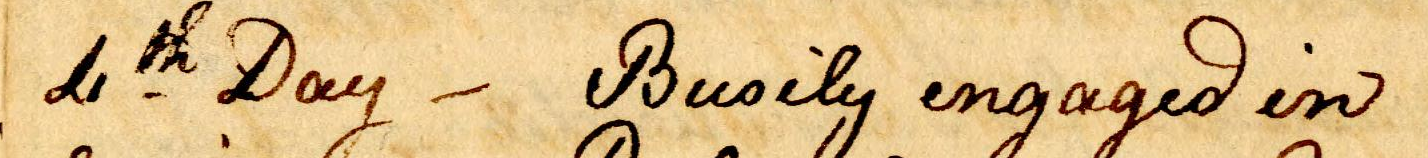4^th Day- Busily engaged in
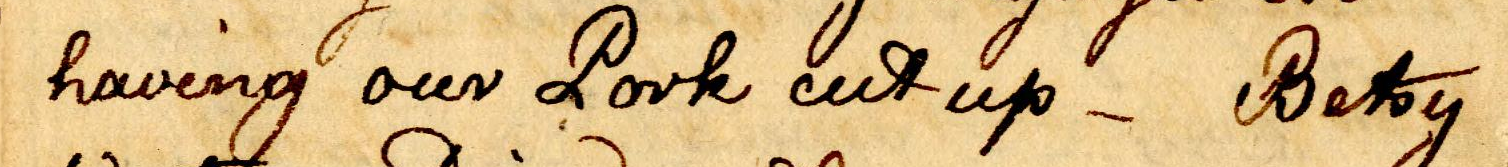having our Pork cut up- Betsy
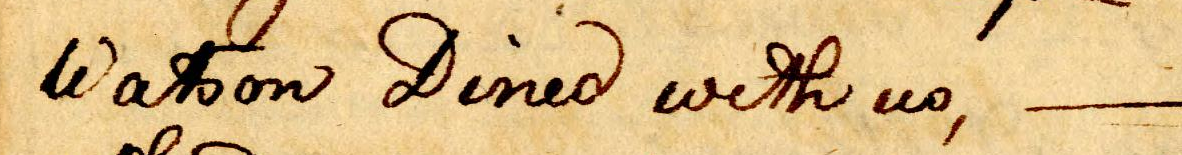Watson Dined with us,-
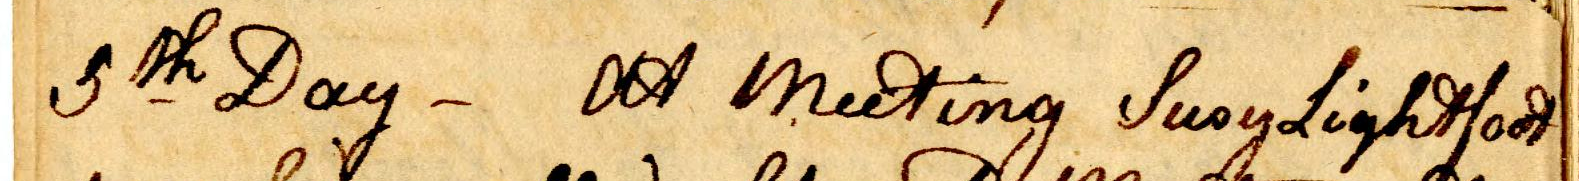5^th Day- At Meeting Susy Lightfoot
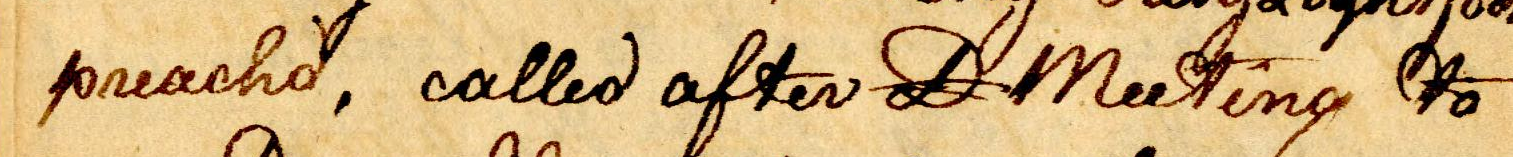preachd, called after [D] Meeting to
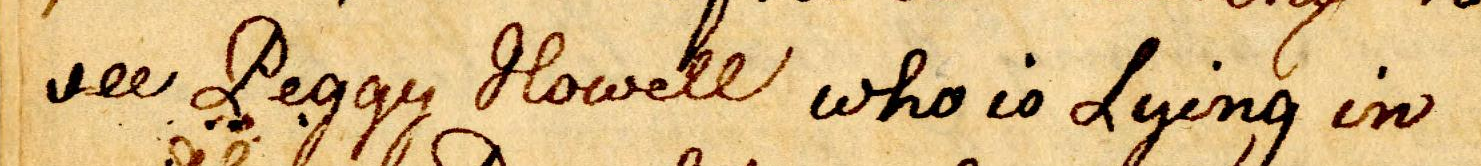see Peggy Howell who is Lying in
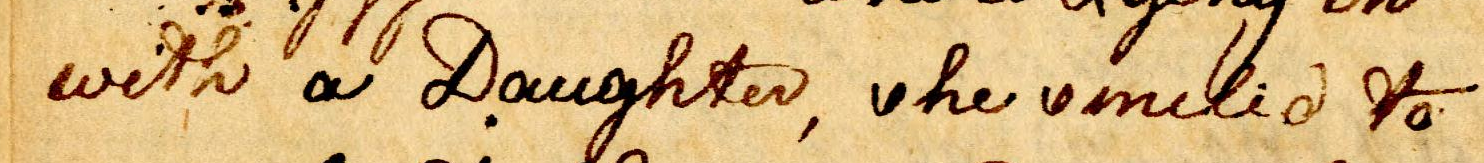with a Daughter, she smiled to
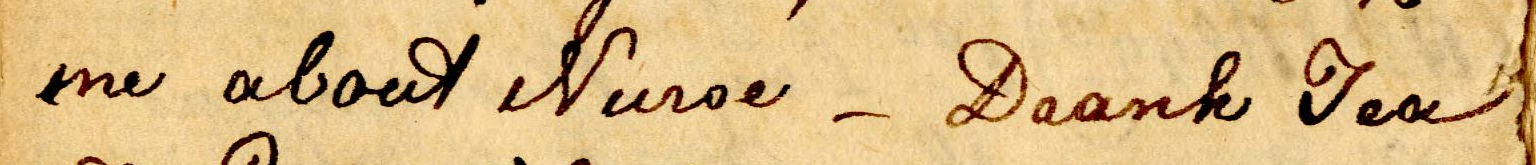me about Nurse- Drank Tea
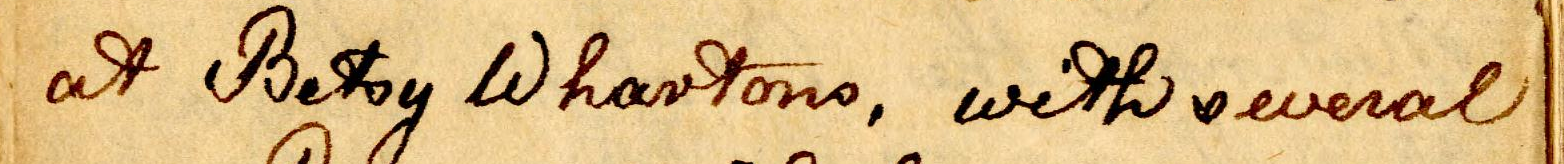at Betsy Whartons, with several
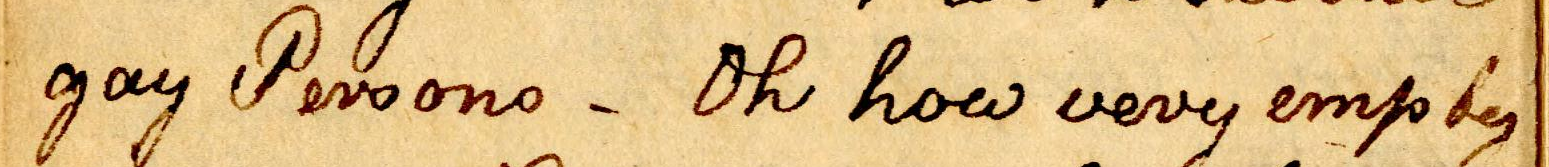gay Persons- Oh how very empty
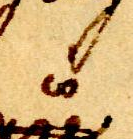is
